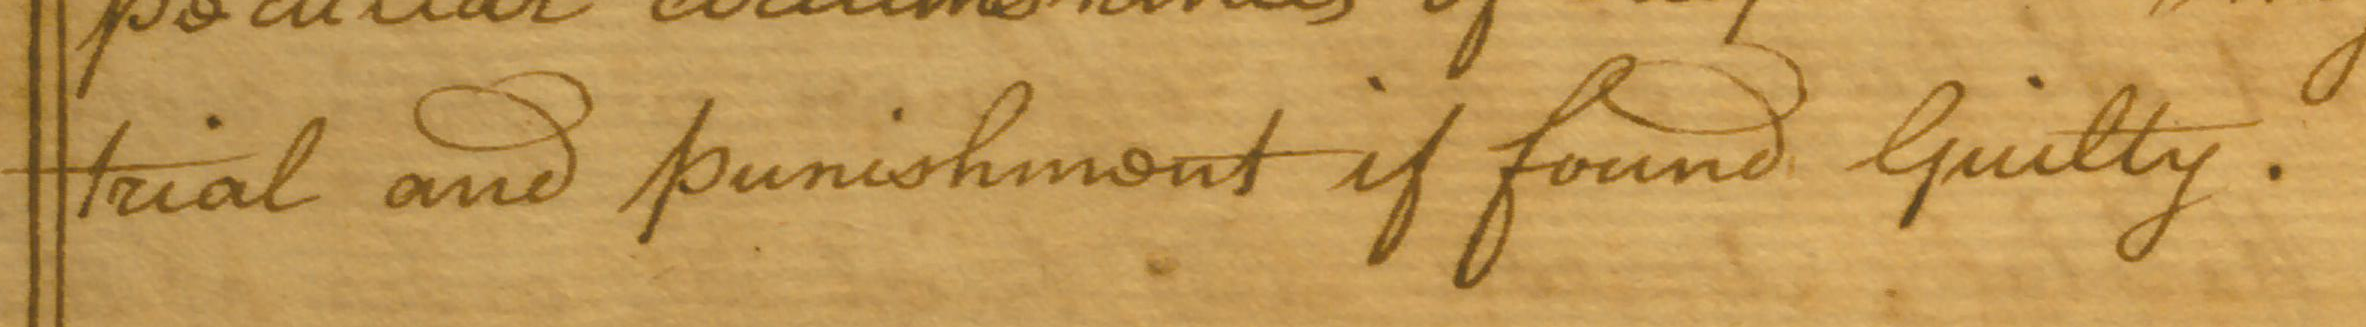trial and punishment if found Guilty.
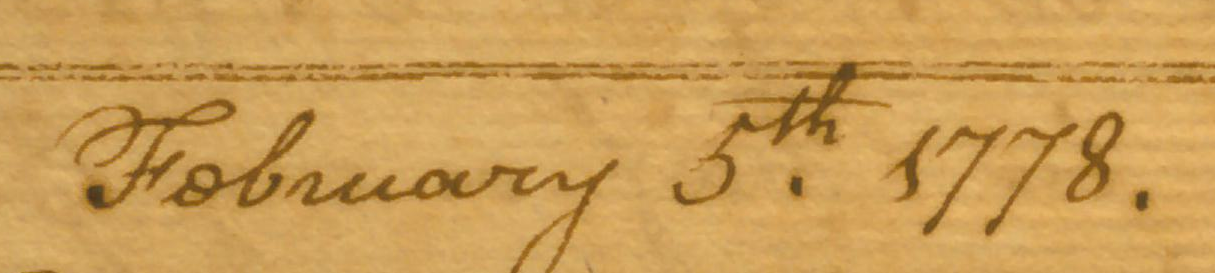February 5^th. 1778.
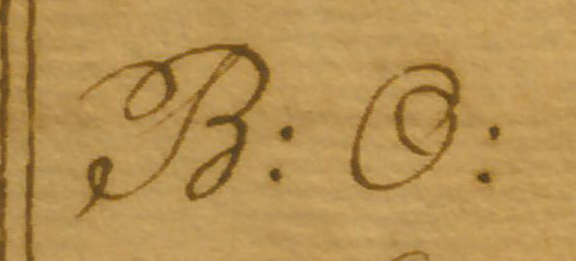B: O:
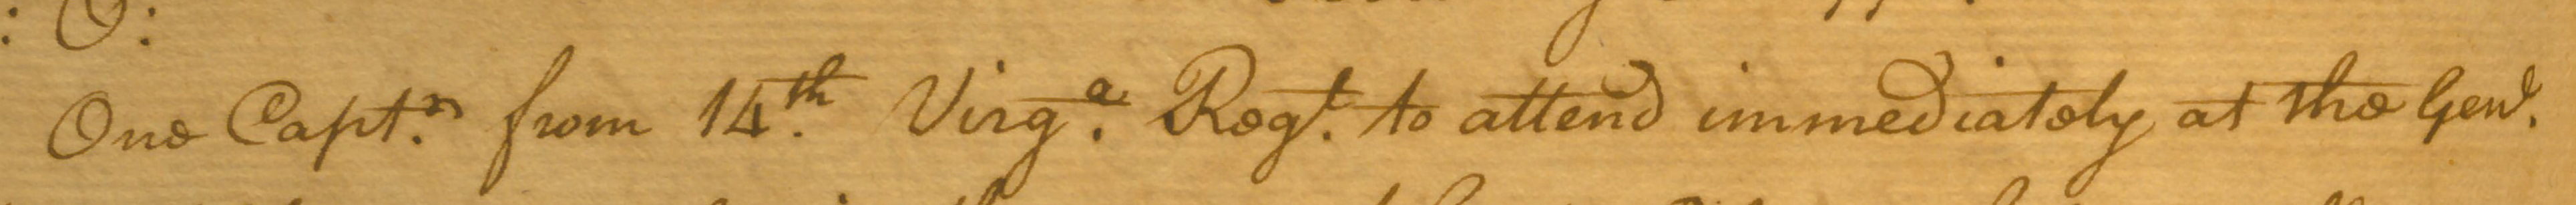One Capt^n. from 14^th. Virg^a. Reg^t. to attend immediately at the Gen^l.
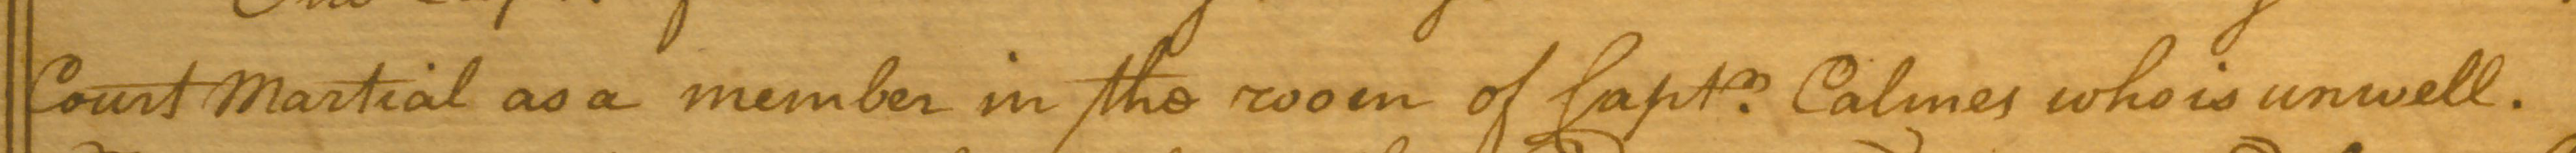Court Martial as a member in the room of Capt^n. Calmes who is unwell.
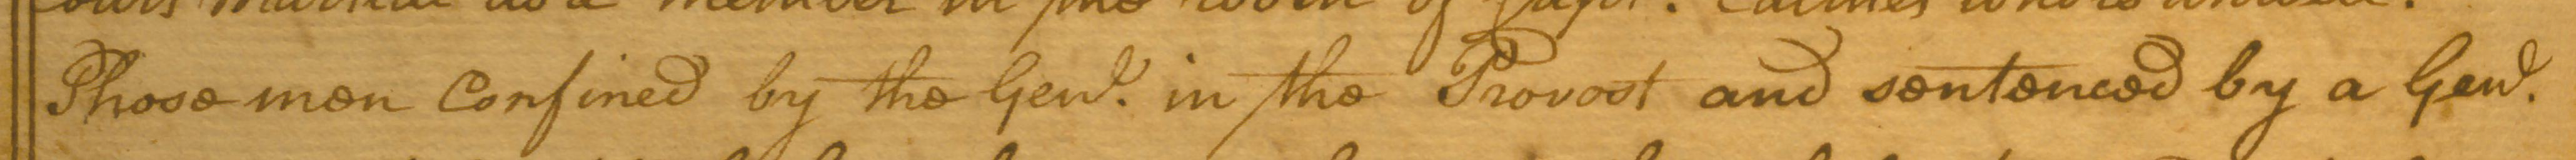Those men confined by the Gen^l. in the Provost and sentenced by a Gen^l.
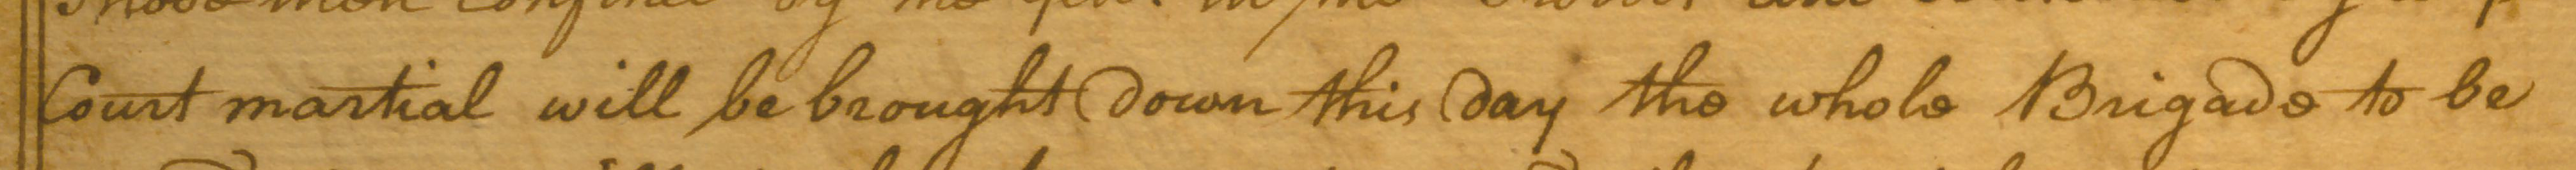Court martial will be brought down this day the whole Brigade to be
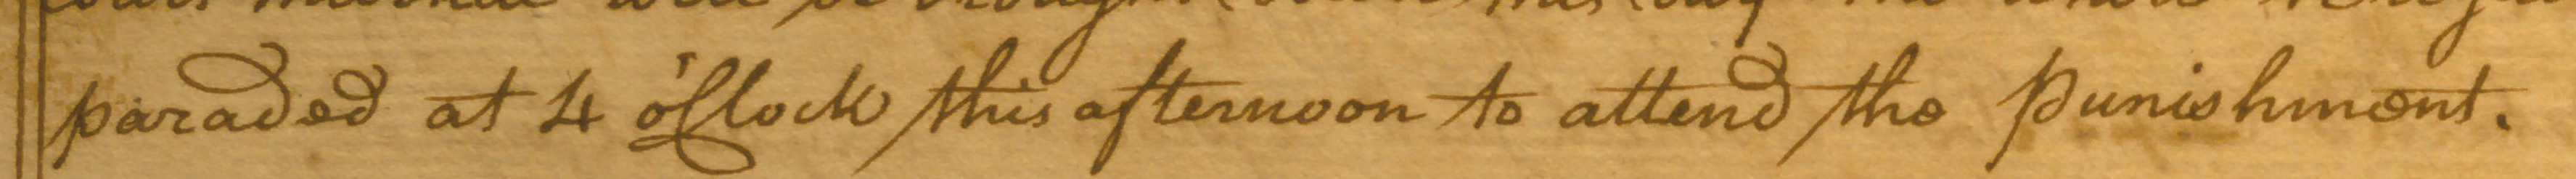paraded at 4 o'Clock this afternoon to attend the punishment.
